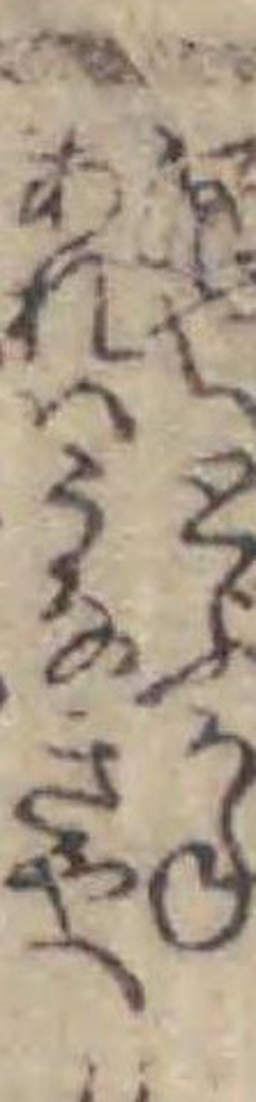あれはうなきやへ
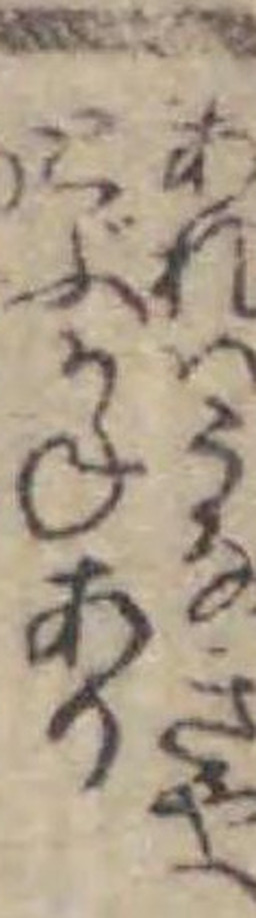とぶかねあり
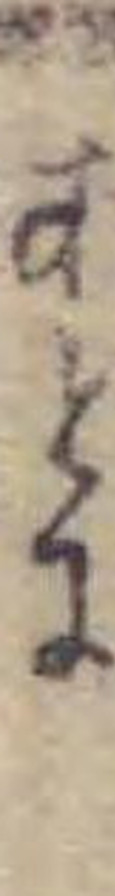あとに
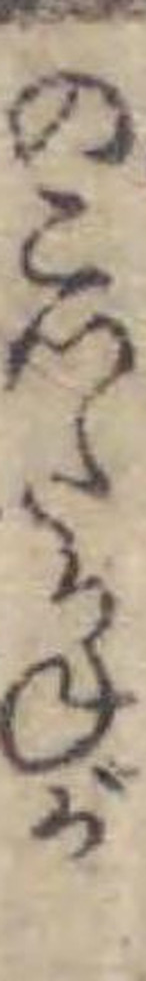のこつたかねが
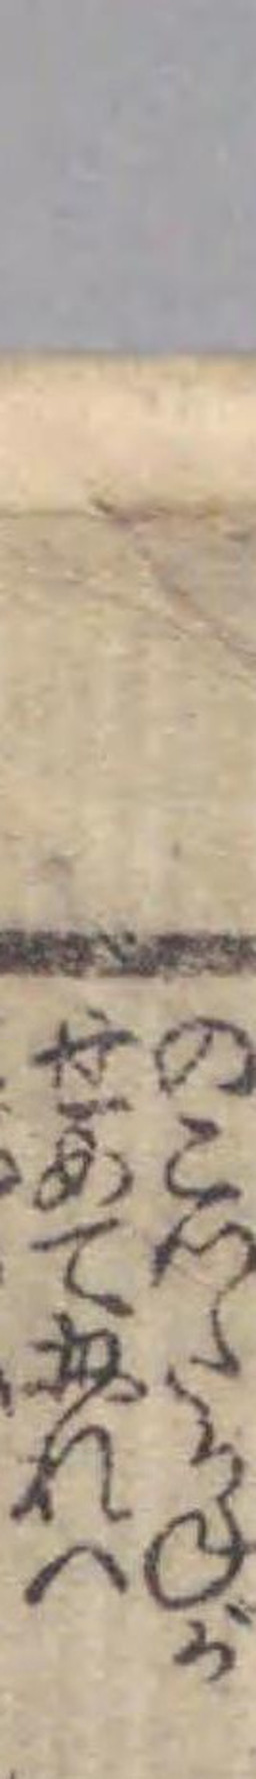せめておれは
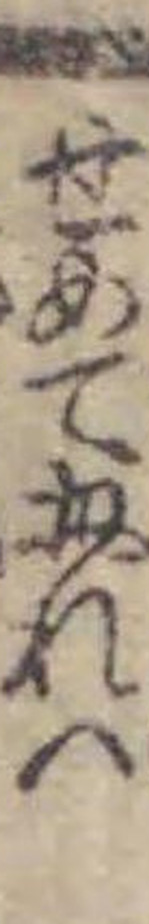せめておれは
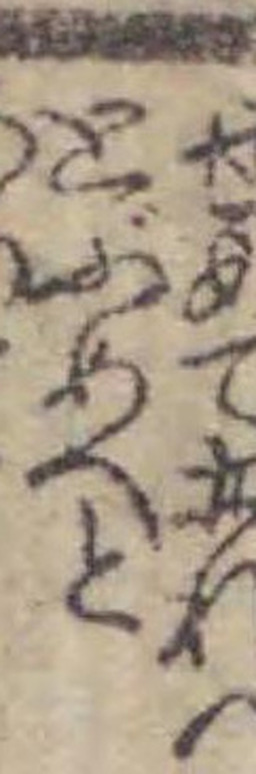とぶめへと
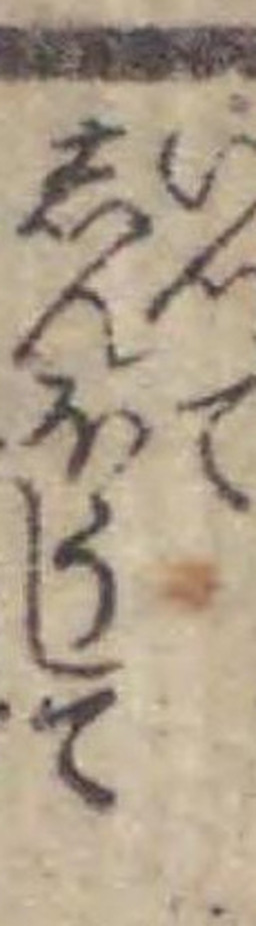しんほうして
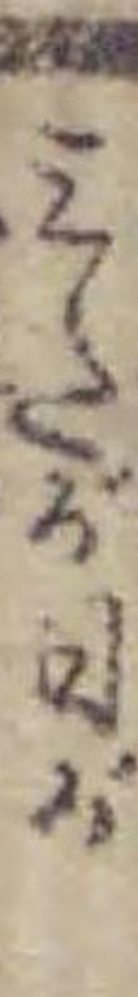みたが日が
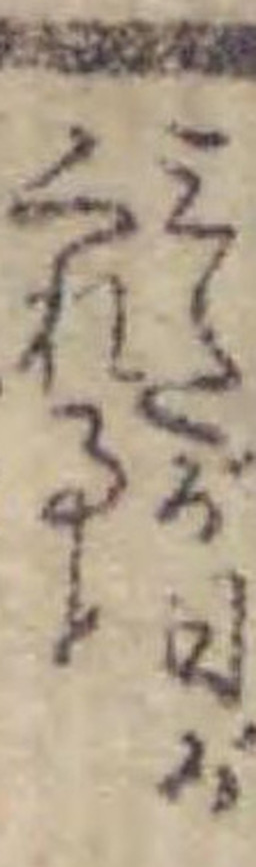くれると
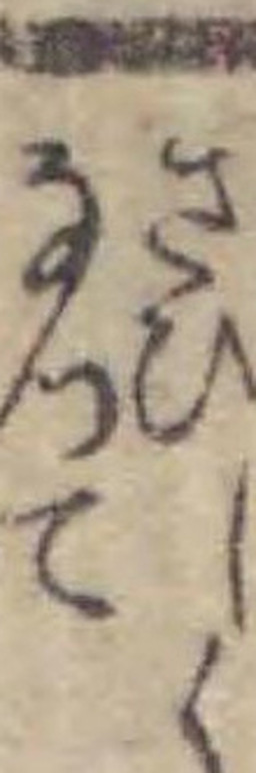なつて
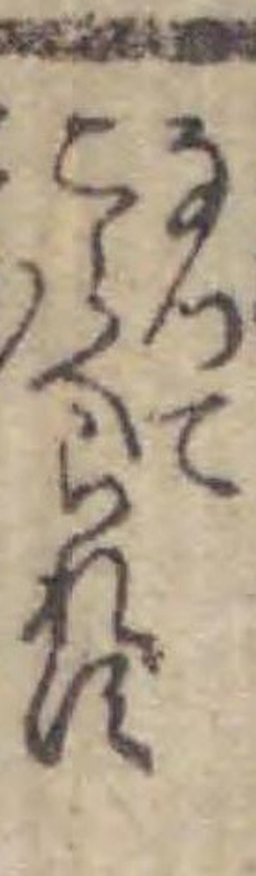こらへられず
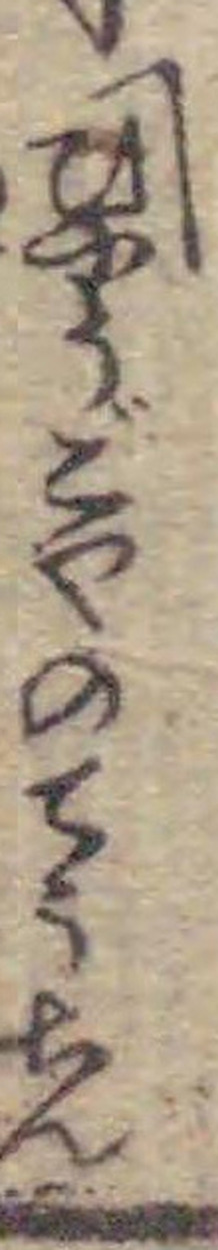〽ひやうごやのてうちん
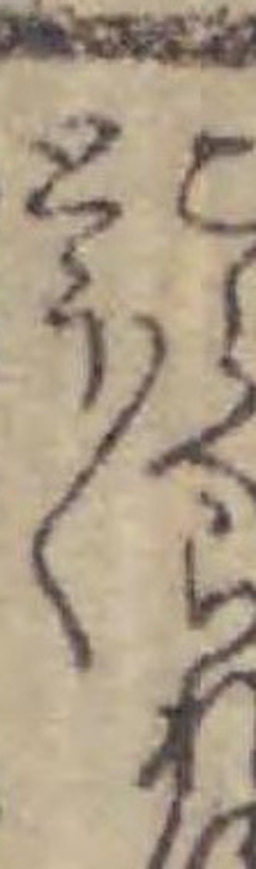とう〳〵
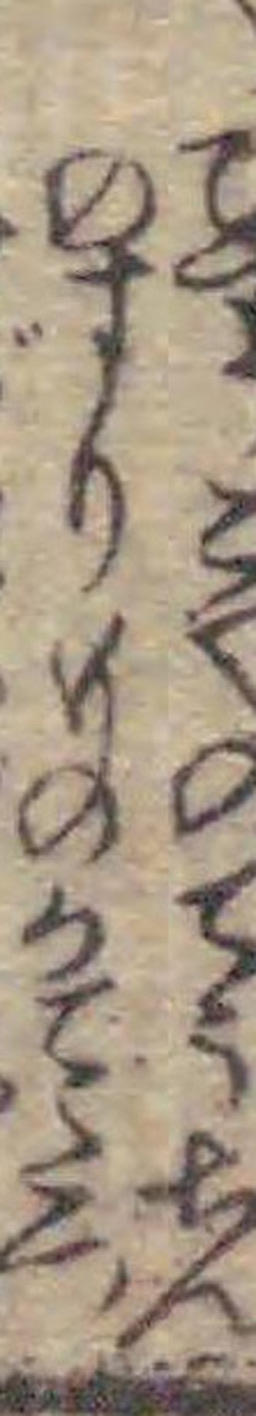のすりものかてたつ
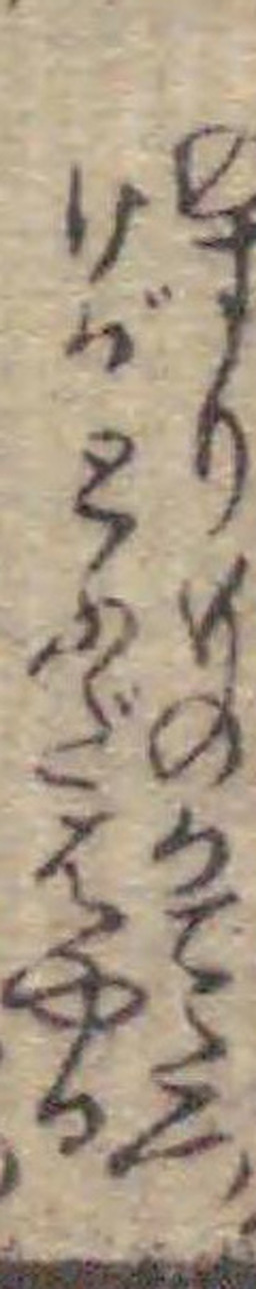けがとふだはやる
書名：新鋳小判 : 3巻
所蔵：国立国会図書館 National Diet Library, JAPAN
